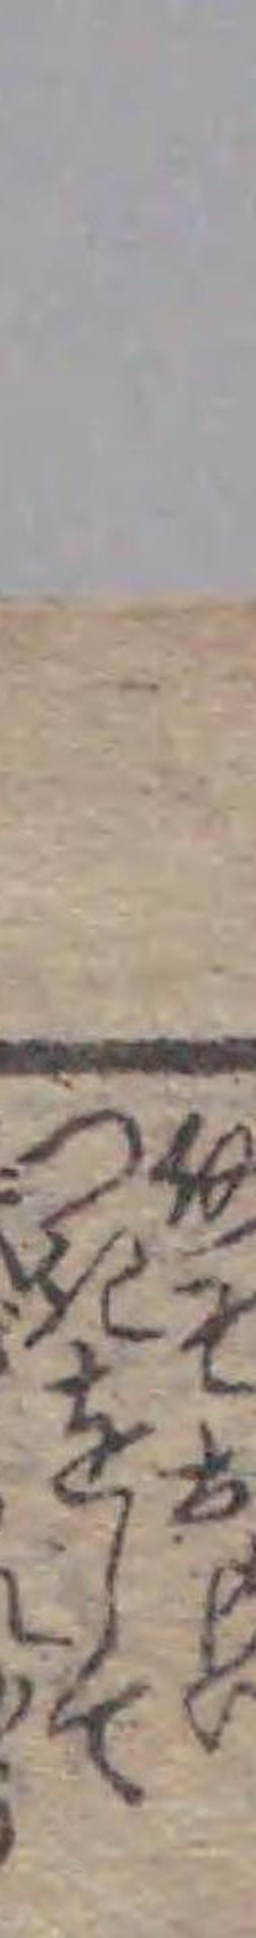つきをして
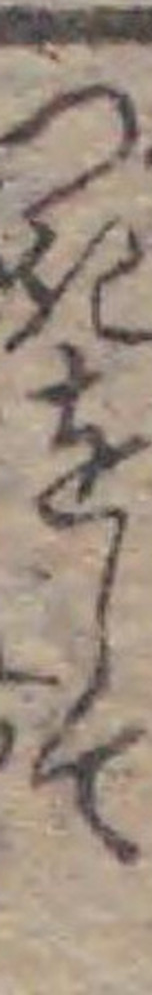つきをして
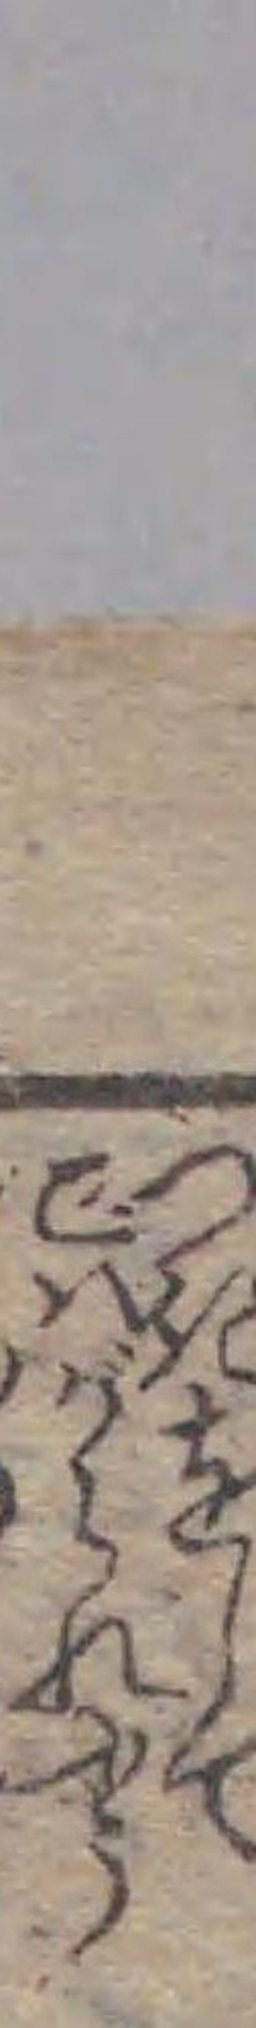こはがられやう
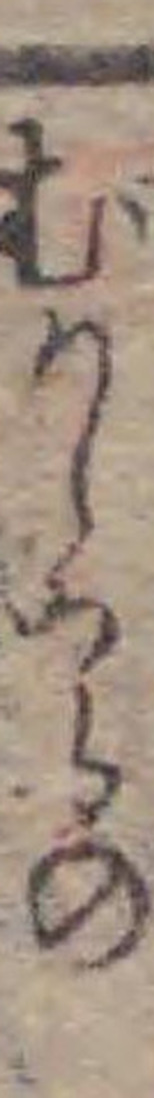むかしからの
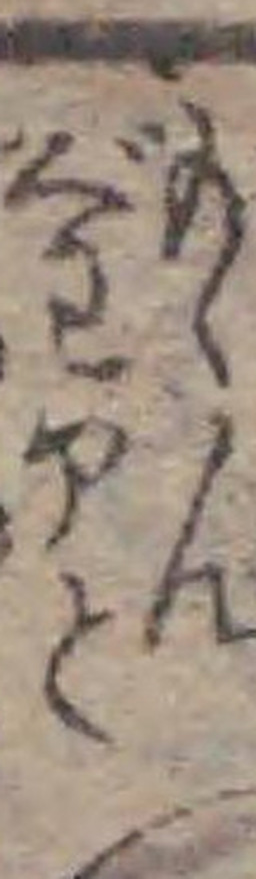ぐわアと
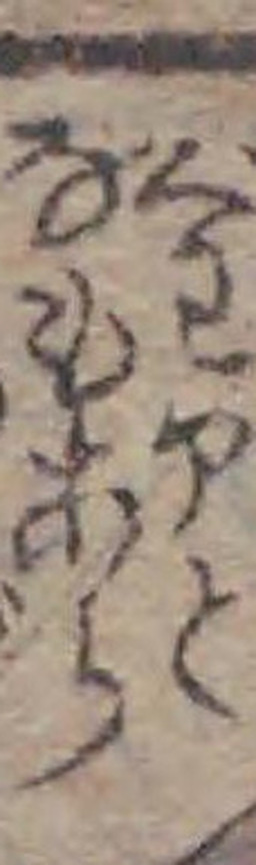なもあら
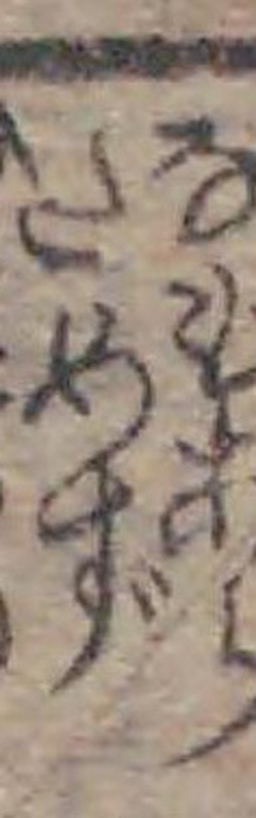ためず
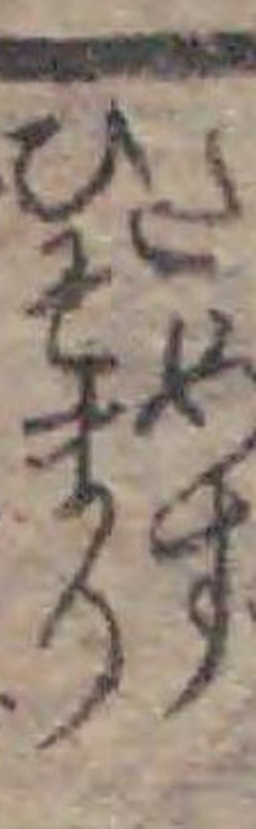ひそまり
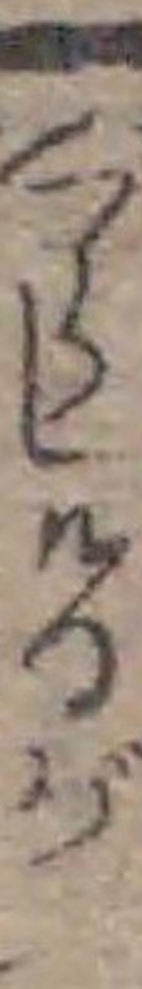くらしけるが
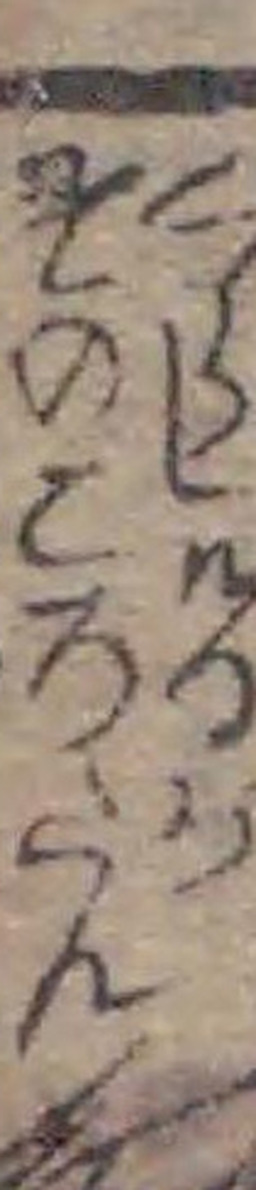そのころたん
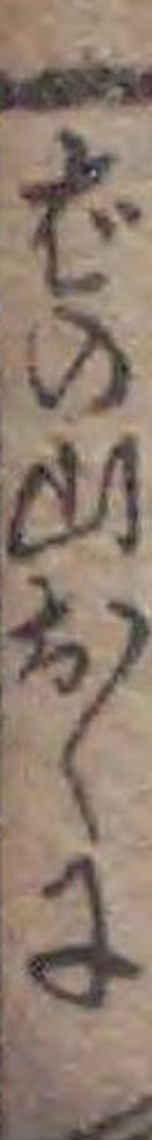ばの山おくに
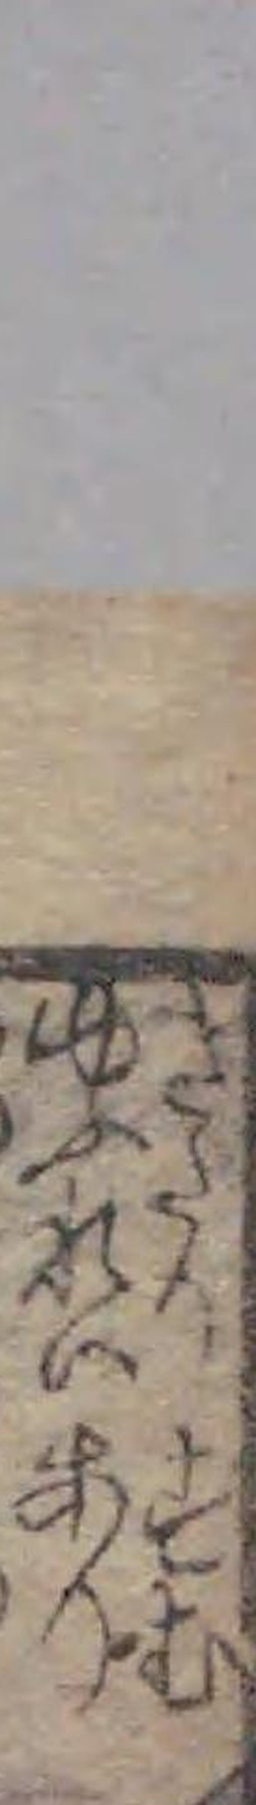ゆふれいあり
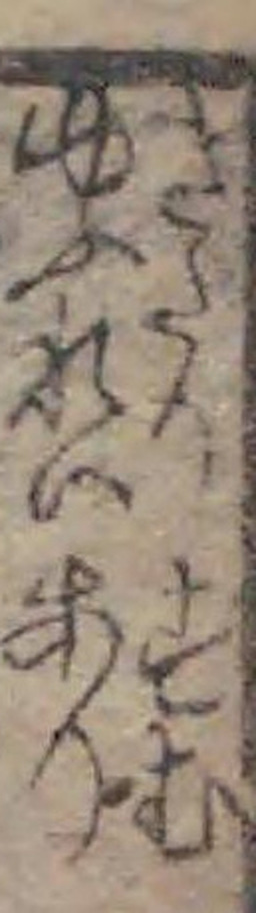ゆふれいあり
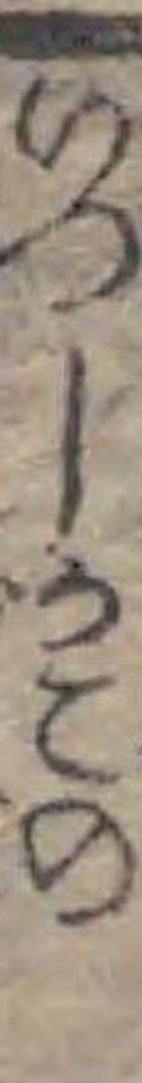いつしかこの
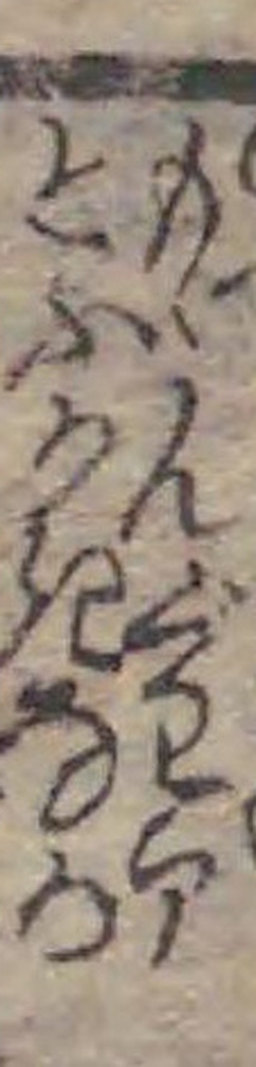とふかきなか
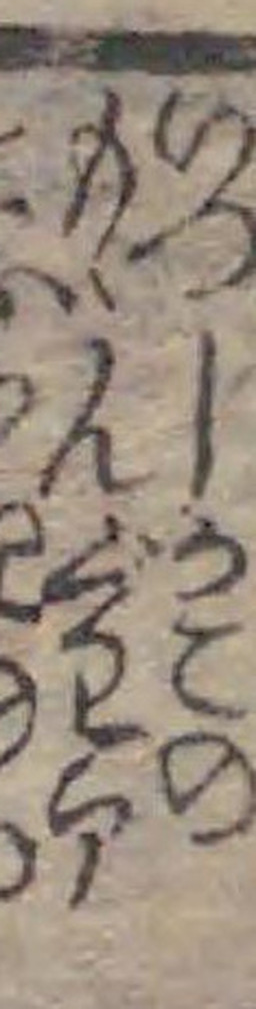もゝんぐわア
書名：化物見越松 : 2巻
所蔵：国立国会図書館 National Diet Library, JAPAN
